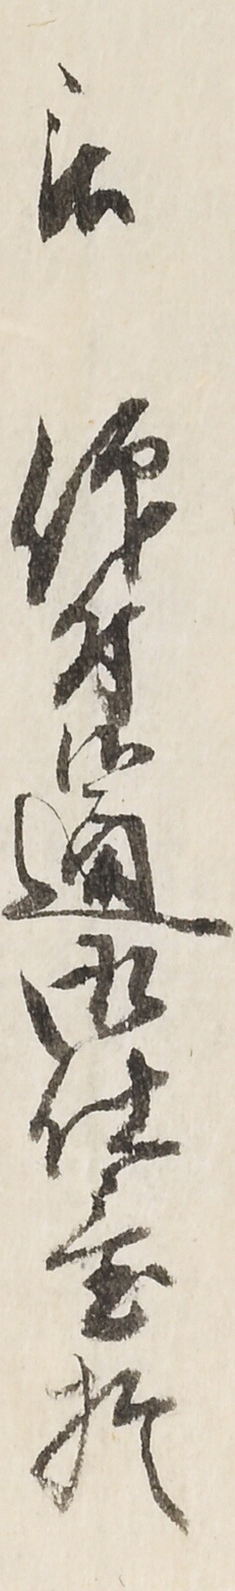被仰付候通御仕置於
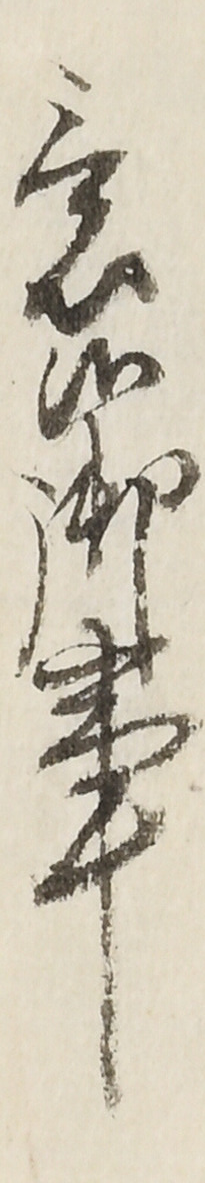意候御事

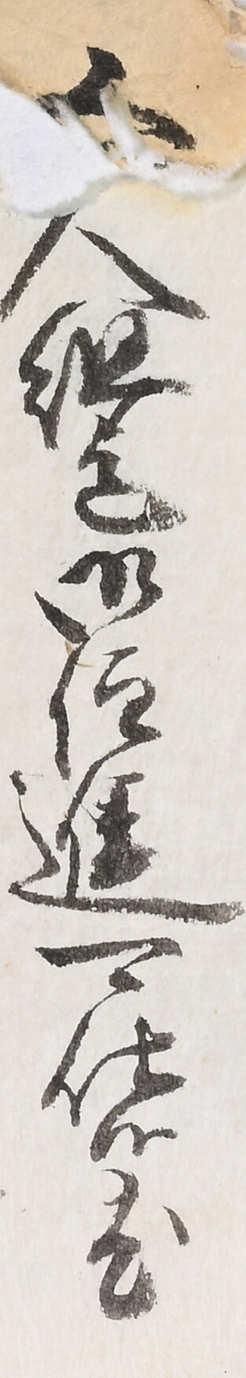五人組迄御注進可仕候尤
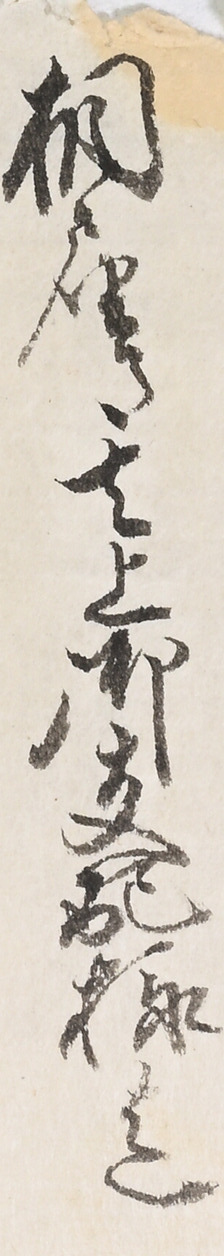相届ケ其上御支配様迄
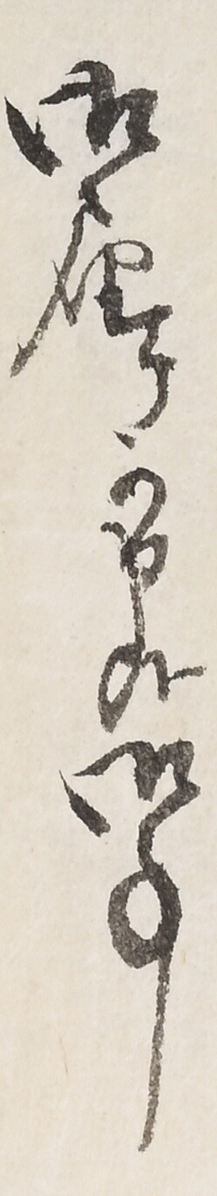御届ケ可申候御事
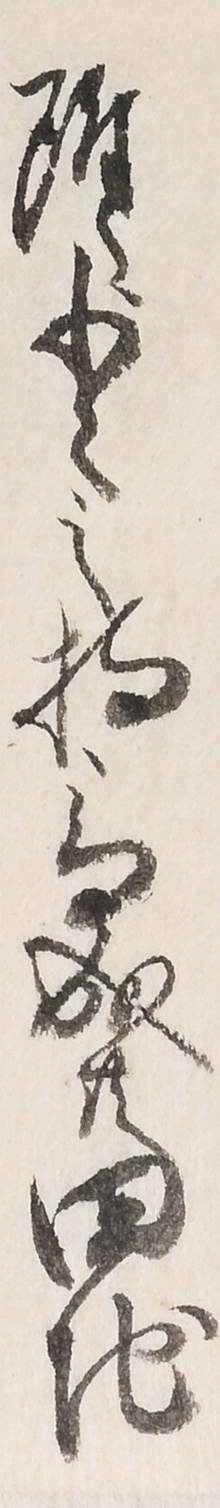附り少々之高成共田地
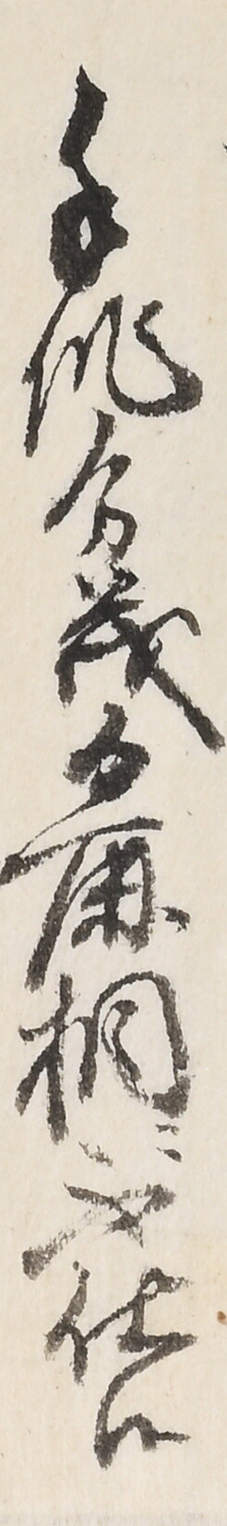手作分も麤相ニ不仕候
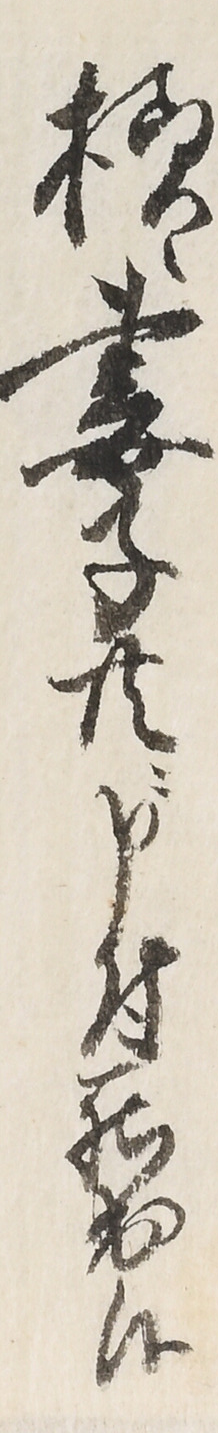様ニ妻子共ニ申付罷出候
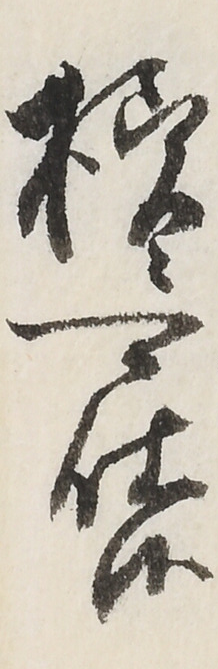様ニ可仕候
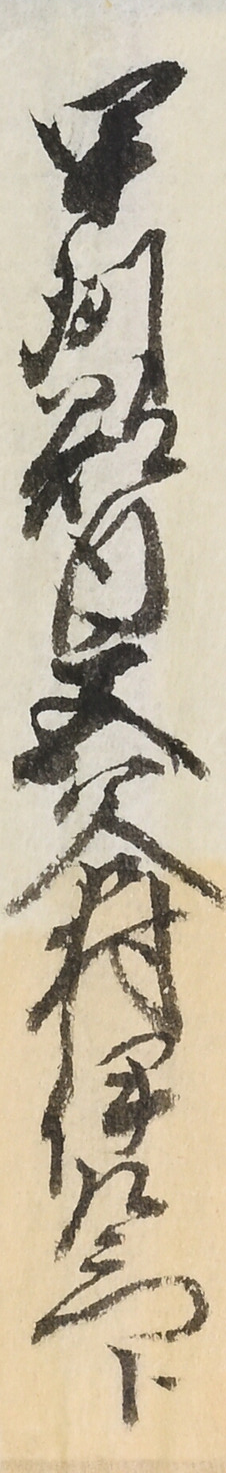甲州郡内五谷村伊左衛門ト
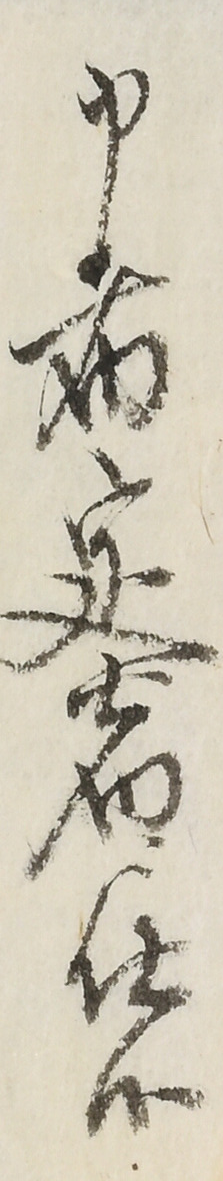申者定宿仕候
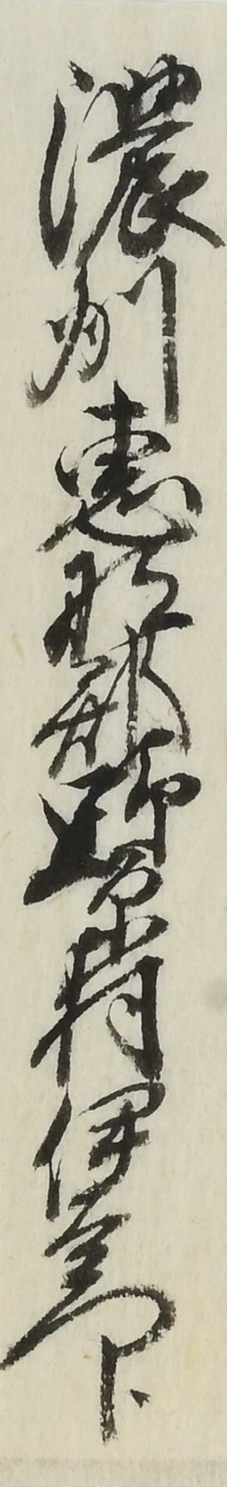濃州恵那郡野原村伊右衛門ト
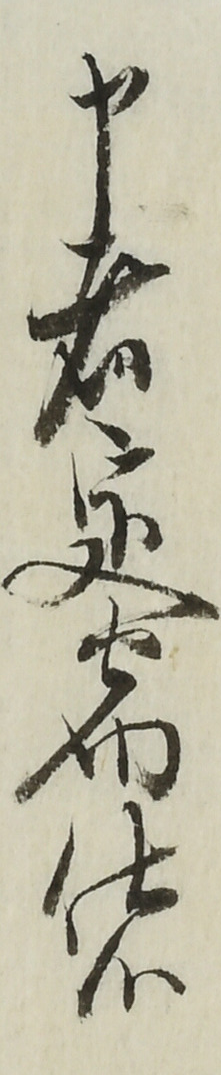申者定宿仕候

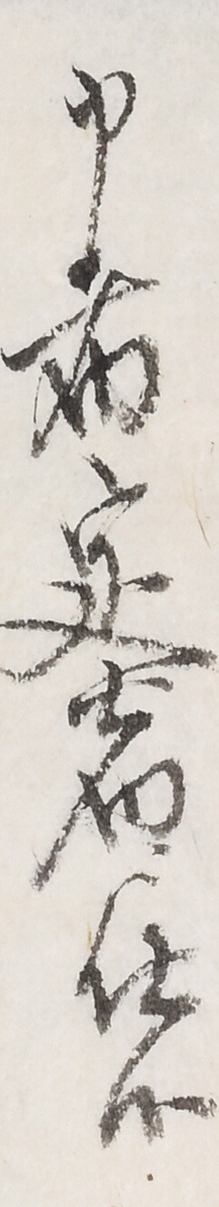申者定宿仕候
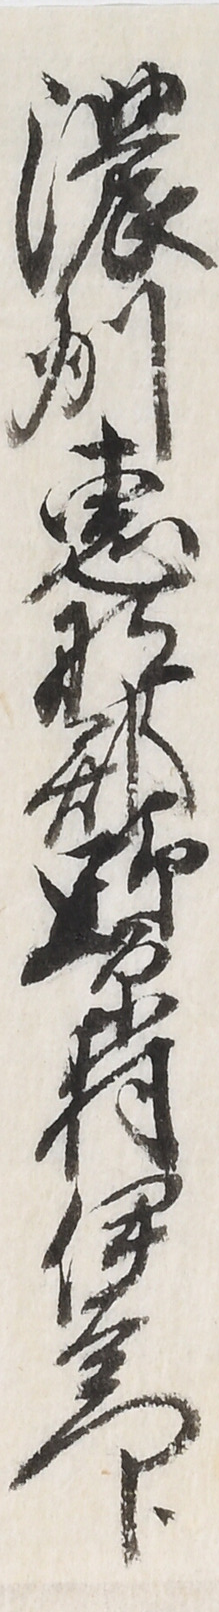濃州恵那郡野原村伊右衛門ト
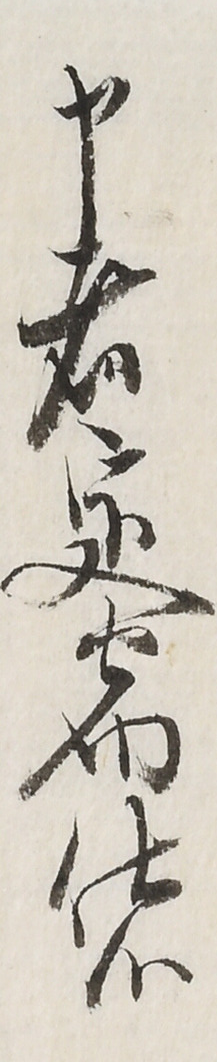申者定宿仕候
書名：文久二壬戌年二月日他国石切稼書上帳
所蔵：伊那市立高遠町図書館・合同会社AMANE
